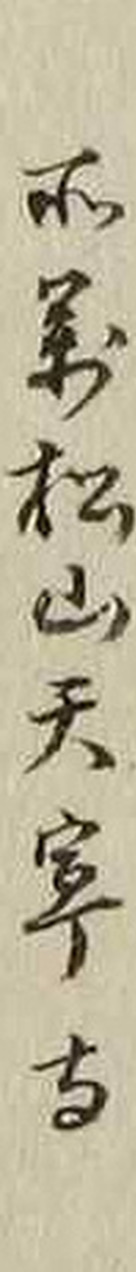所萬松山天寧寺
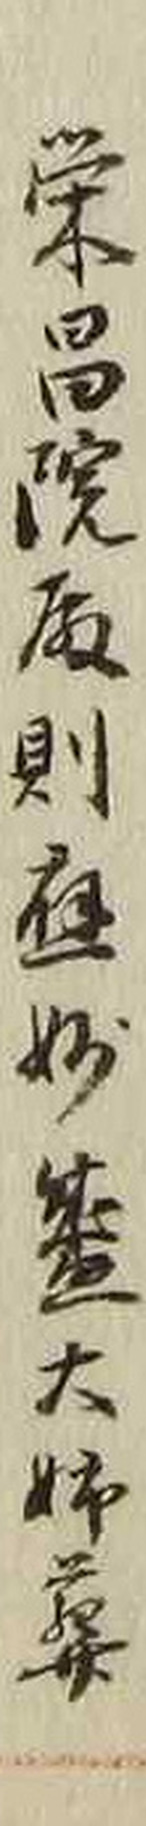栄昌院殿則応妙盛大姉葬
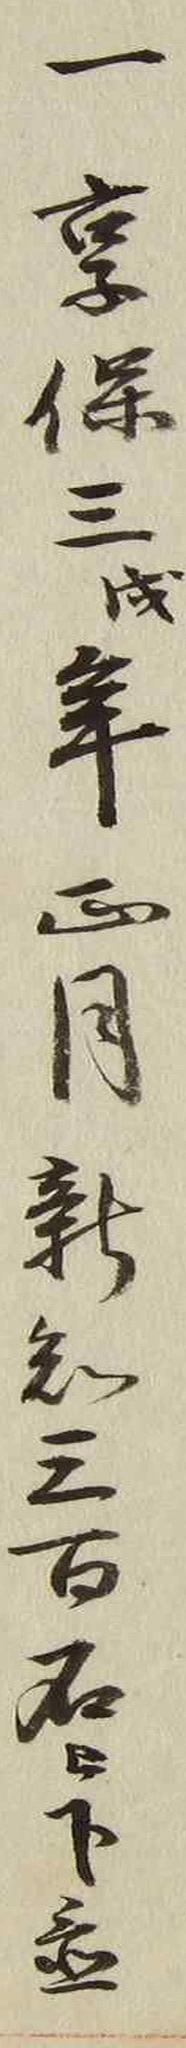一享保三戌年正月新知三百石被下置
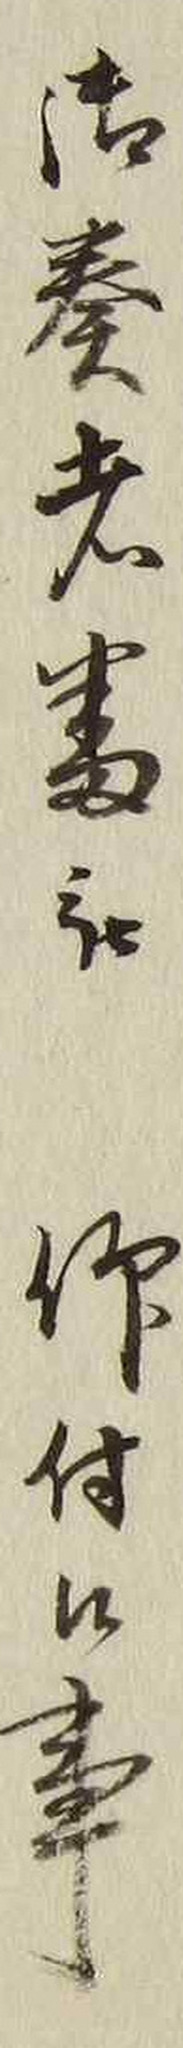御奏者番被仰付候事
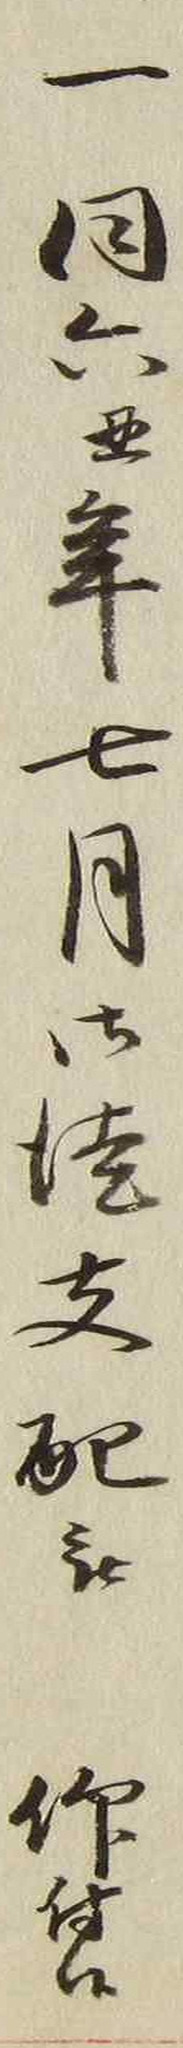一同六丑年七月御徒支配被仰付候
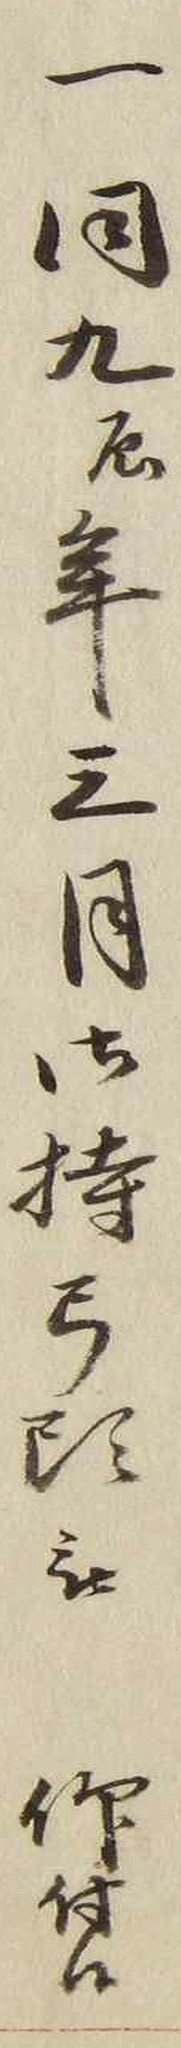一同九辰年三月御持弓頭被仰付候

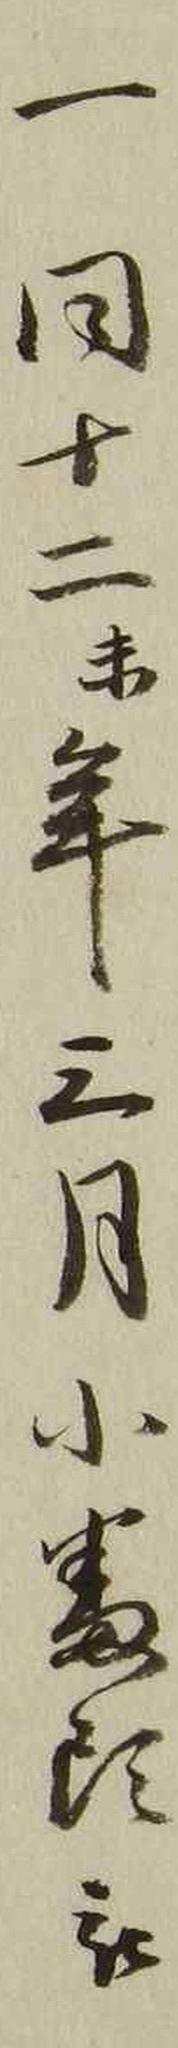一同十二未年三月小番頭被
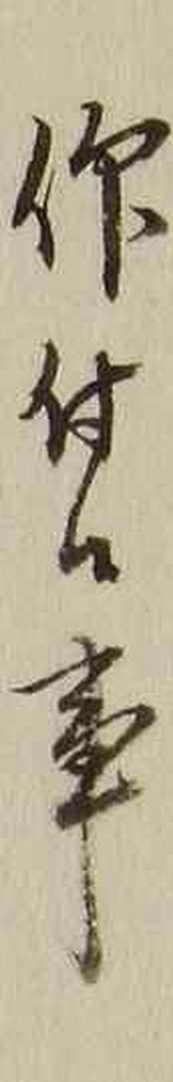仰付候事
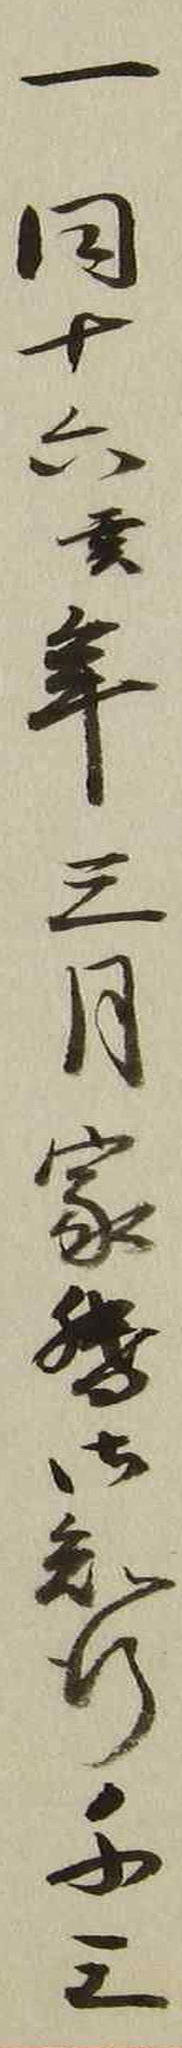一同十六亥年三月家督御知行千三
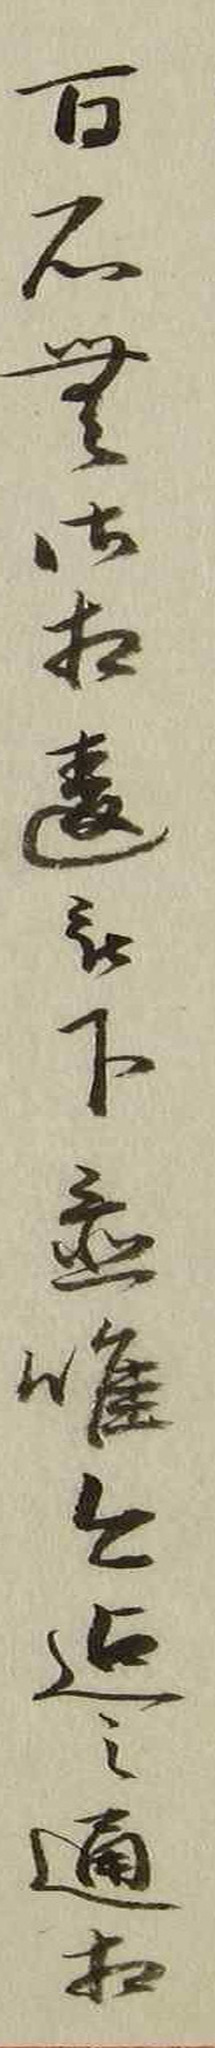百石無御相違被下置唯今迄之通相
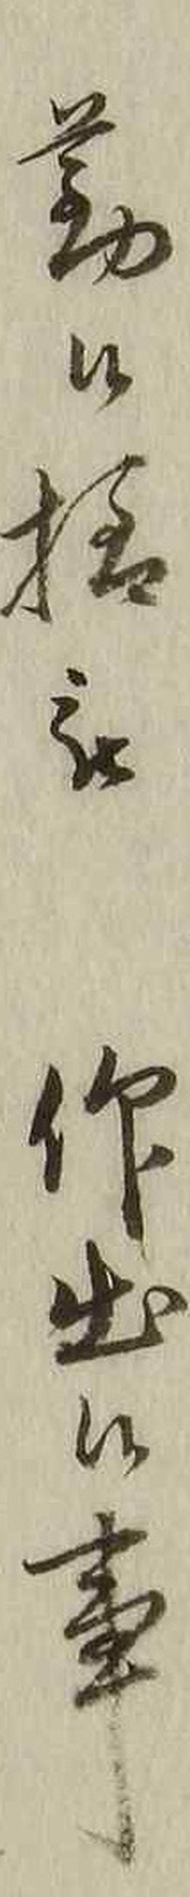勤候様被仰出候事
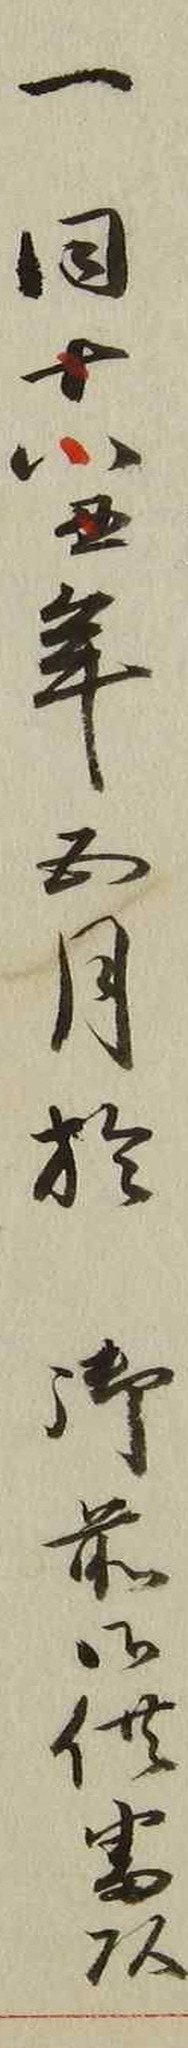一同十八丑年五月於御前御供番頭
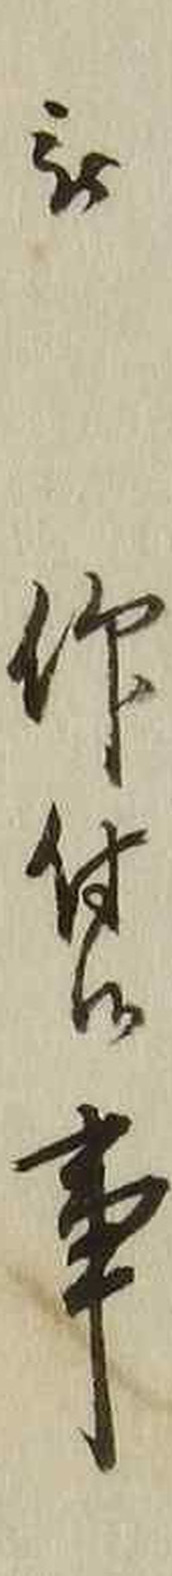被仰付候事
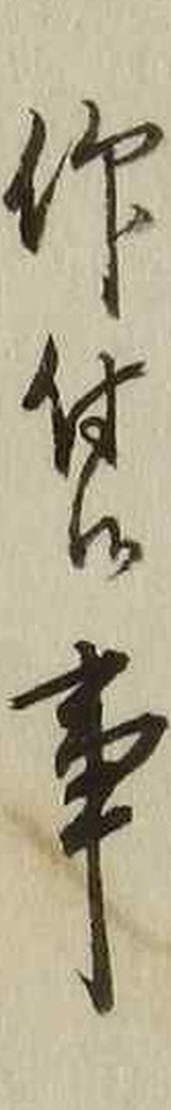仰付候事
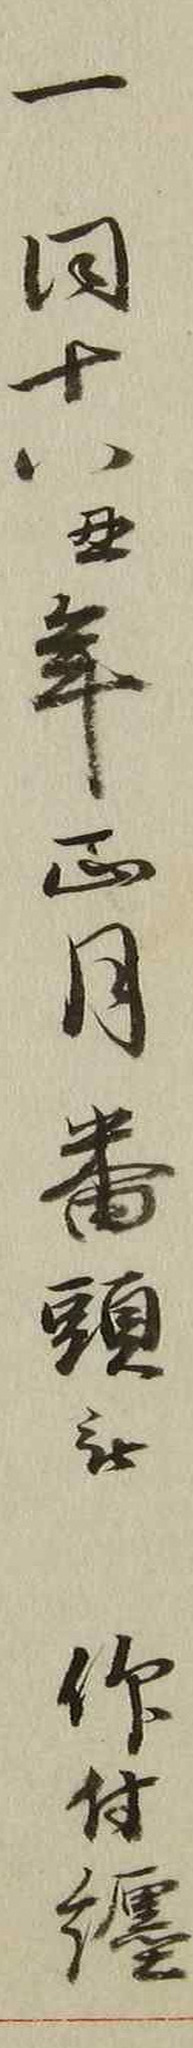一同十八丑年正月番頭被仰付纏
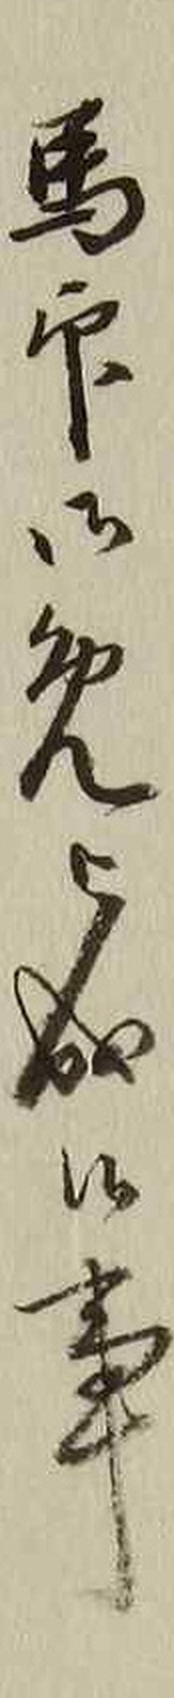馬印御免被成候事
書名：諸士系譜　巻之125　た之部1
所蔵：会津若松市立会津図書館
